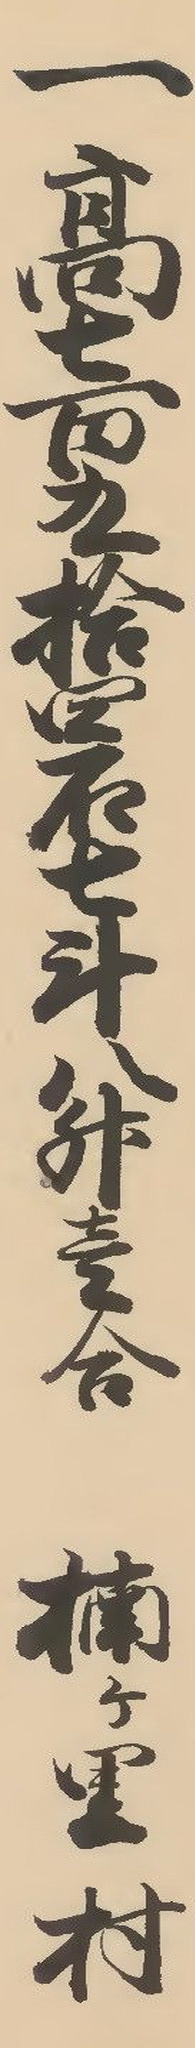一髙七百九拾四石七斗八升壱合楠ケ里村
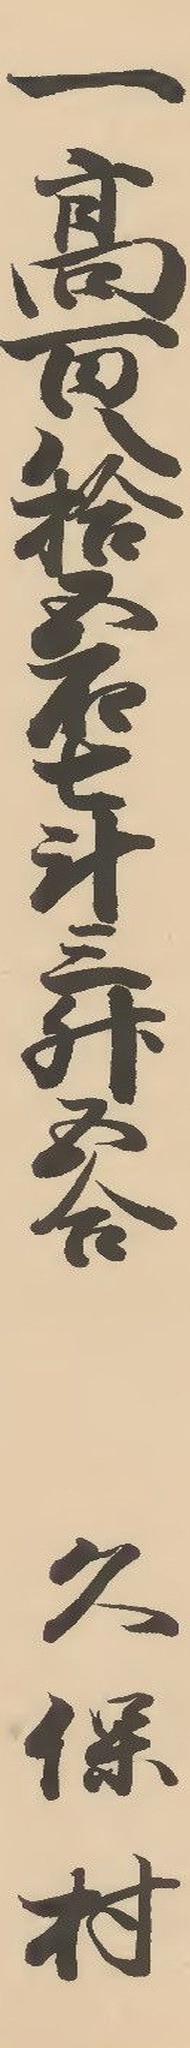一髙百八拾五石七斗三升五合久保村
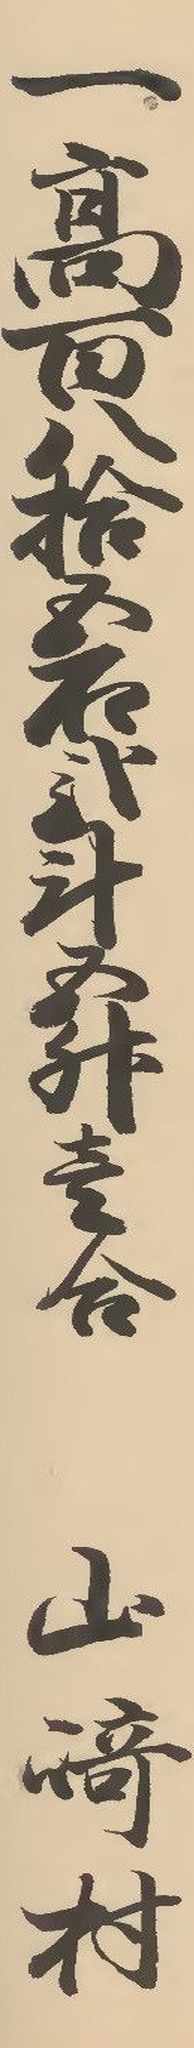一髙百八拾五石弐斗五升壱合山崎村
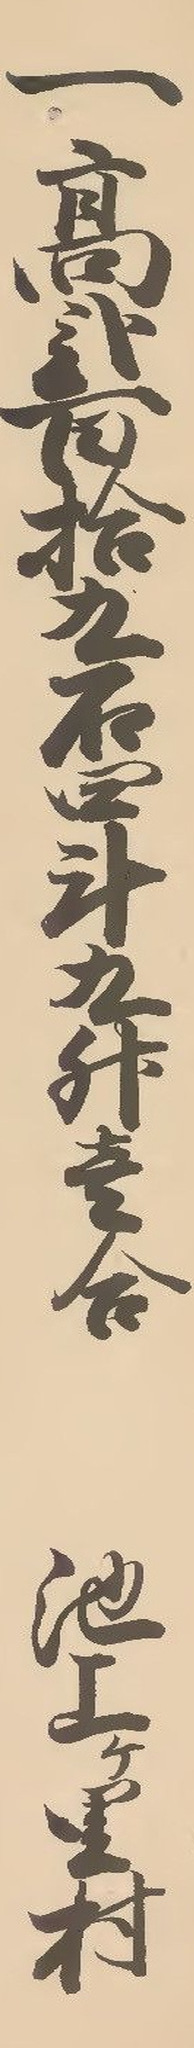一髙弐百拾九石四斗九升壱合池上ケ里村
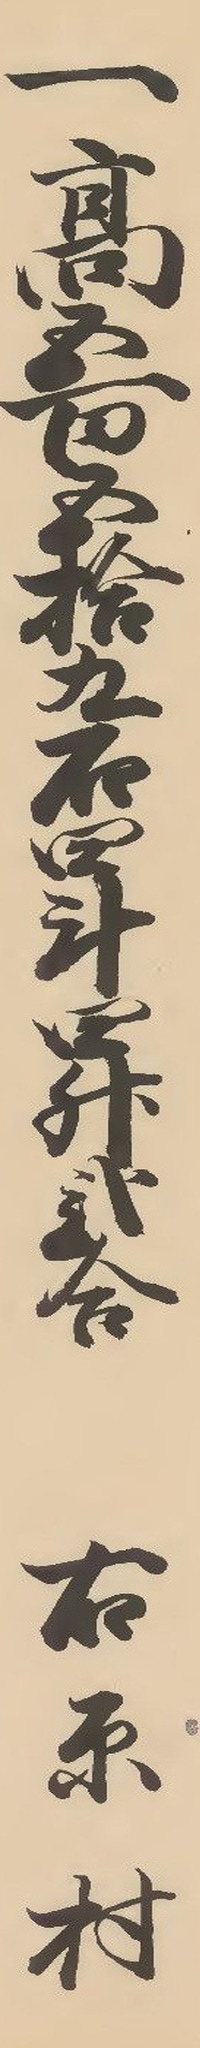一髙五百五拾九石四斗四升弐合右原村
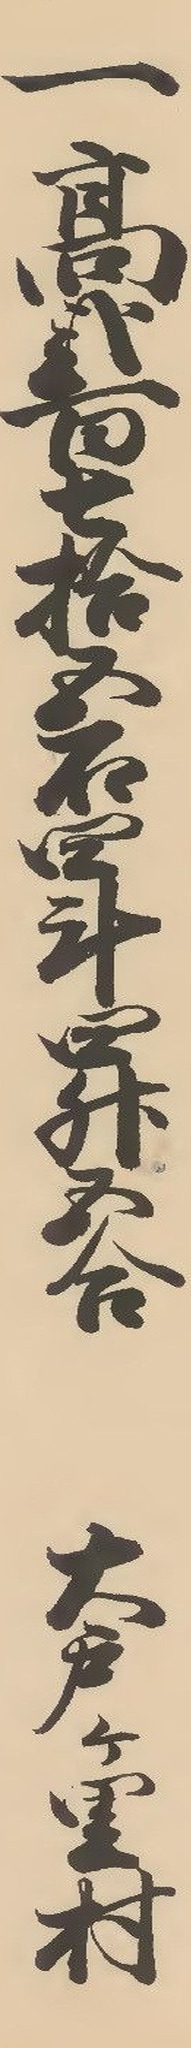一髙弐百七拾五石四斗四升五合大戸ケ里村
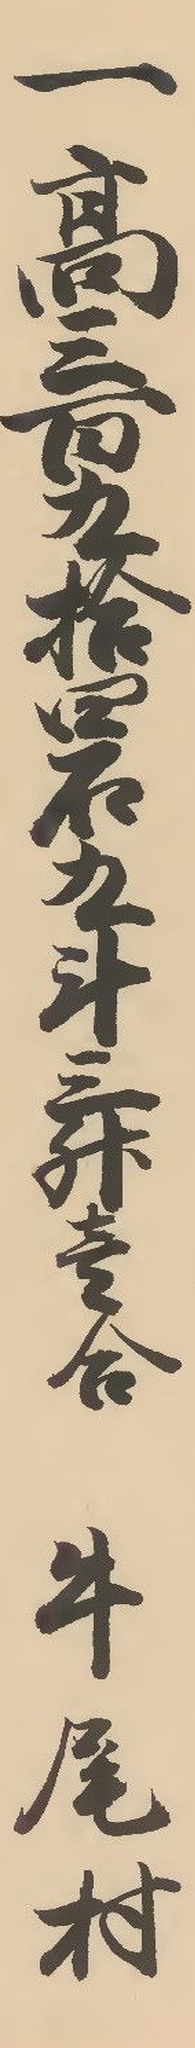一髙三百九拾四石九斗三升壱合牛尾村

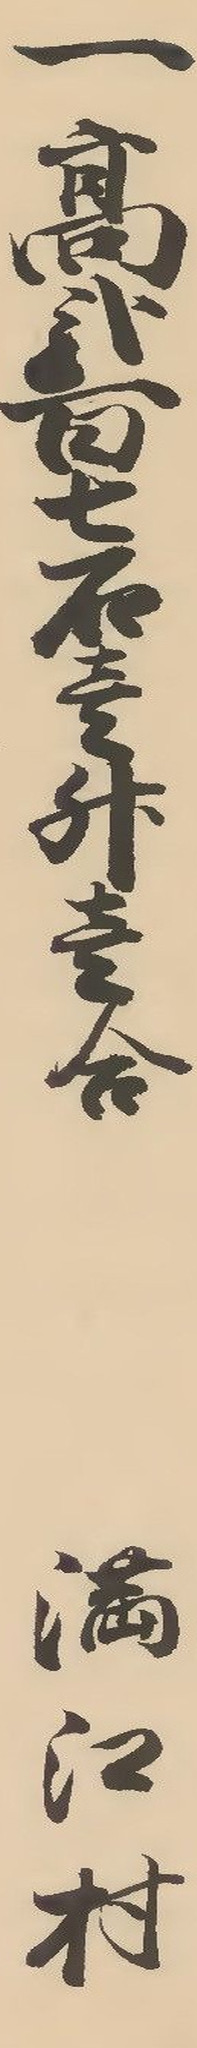一髙弐百七石壱升壱合満江村
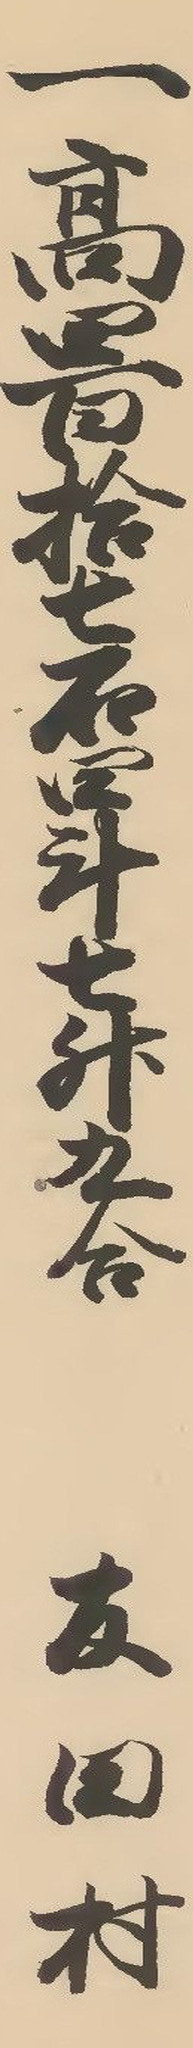一髙四百拾七石四斗七升九合友田村
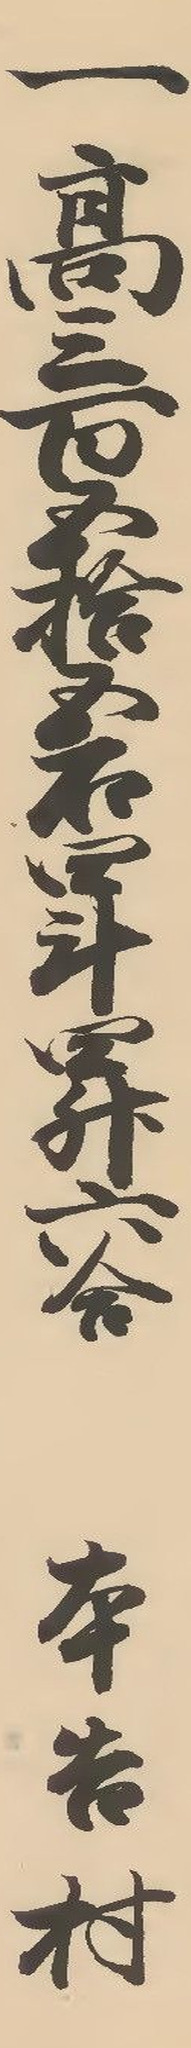一髙三百五拾五石四斗四升六合本告村
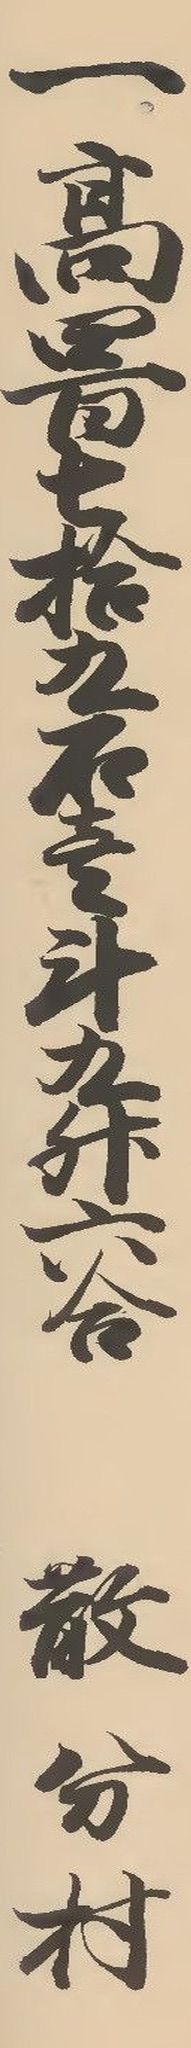一髙四百七拾九石壱斗九升六合散分村
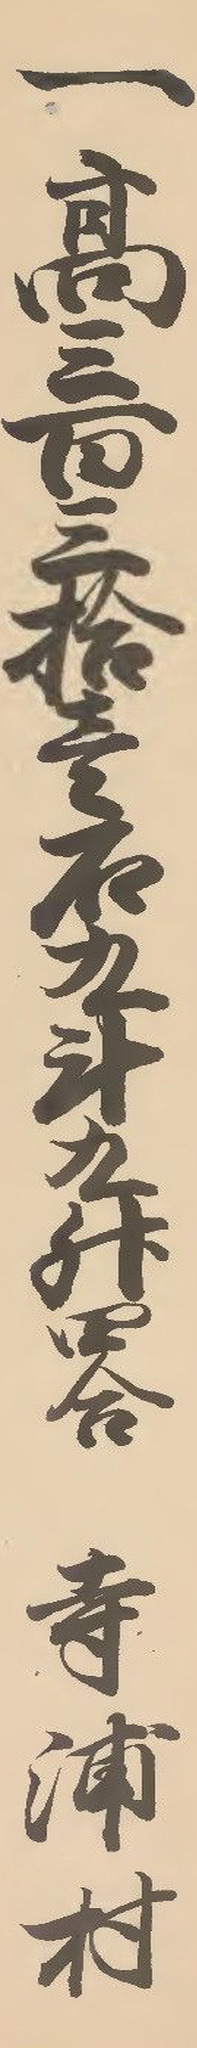一髙三百三拾壱石九斗九升四合寺浦村
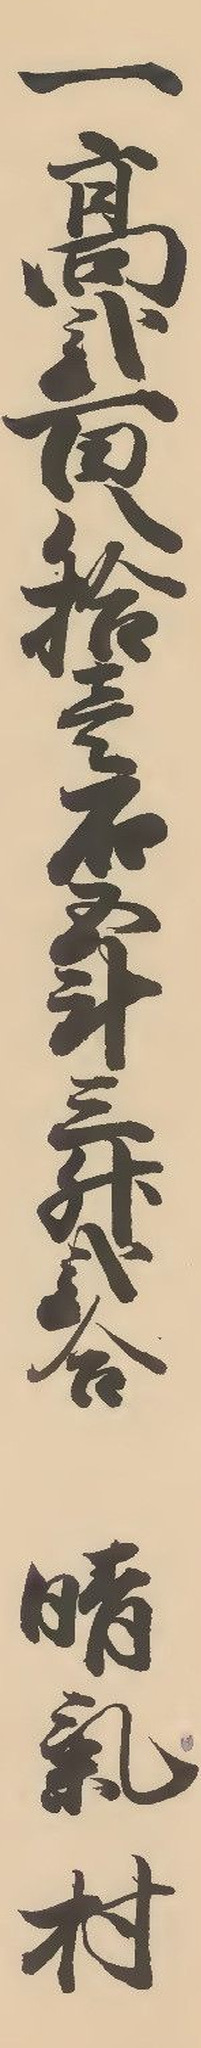一髙弐百八拾壱石五斗三升弐合晴気村
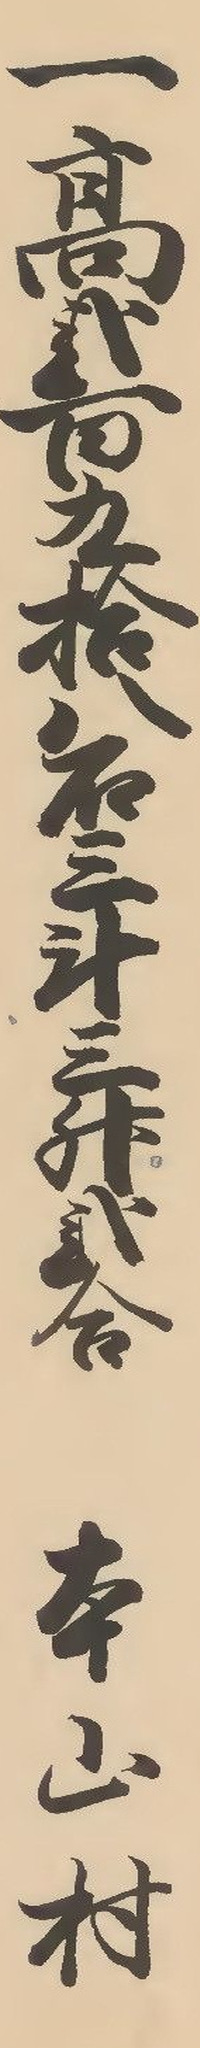一髙弐百九拾八石三斗三升弐合本山村
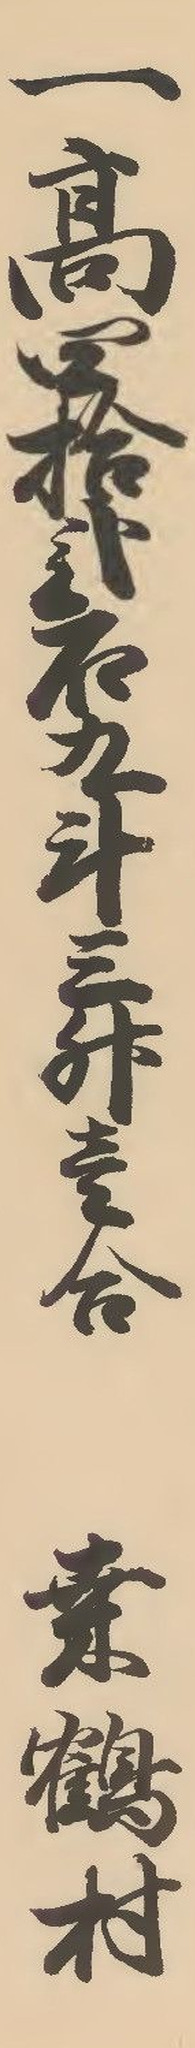一髙四拾弐石九斗三升壱合桑鶴村

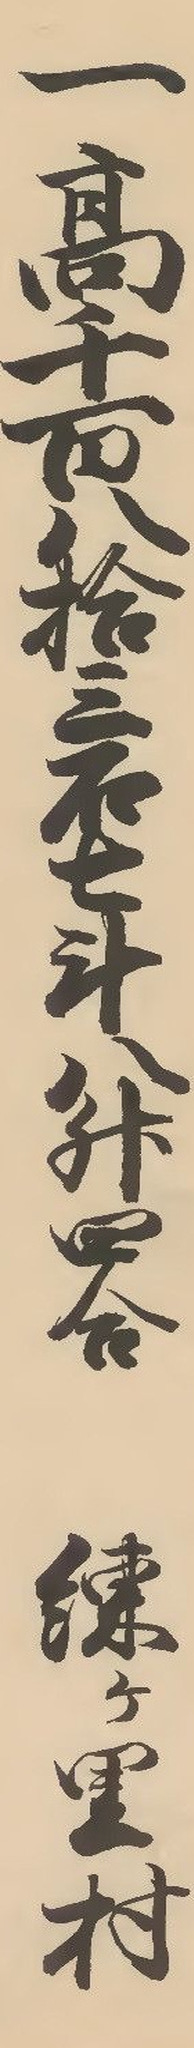一髙千百八拾三石七斗八升四合練ケ里村
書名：肥前国郷帳
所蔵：国立公文書館 National Archives of Japan
